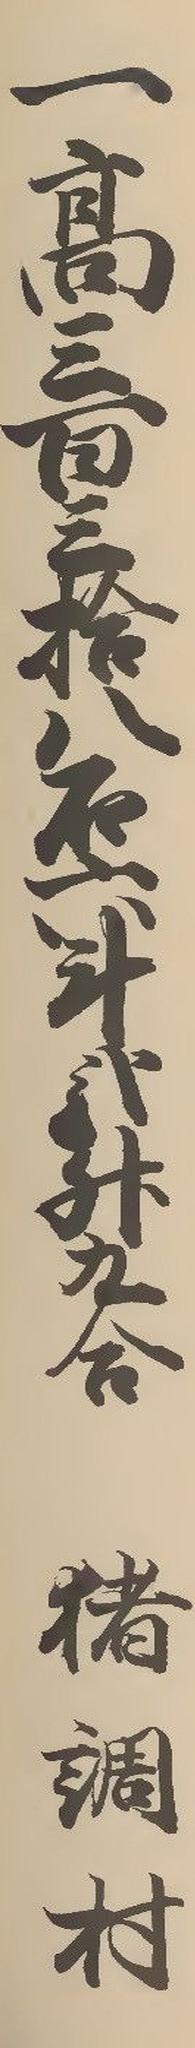一髙三百三拾八石六斗弐升九合猪調村
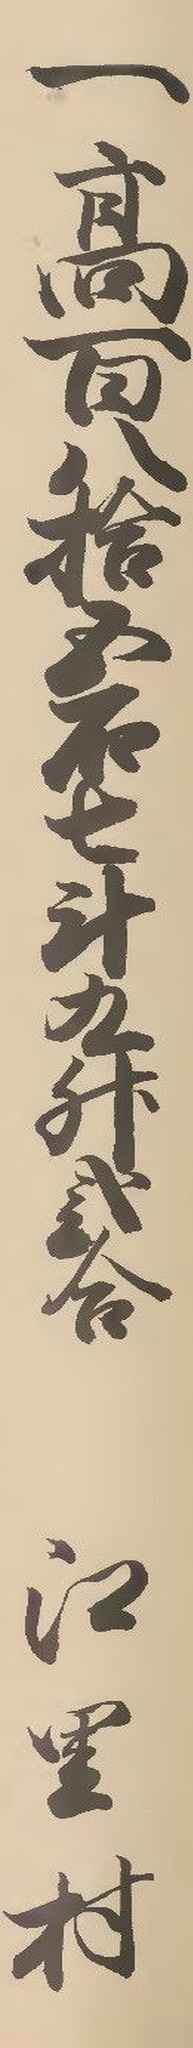一髙百八拾五石七斗九升弐合江里村
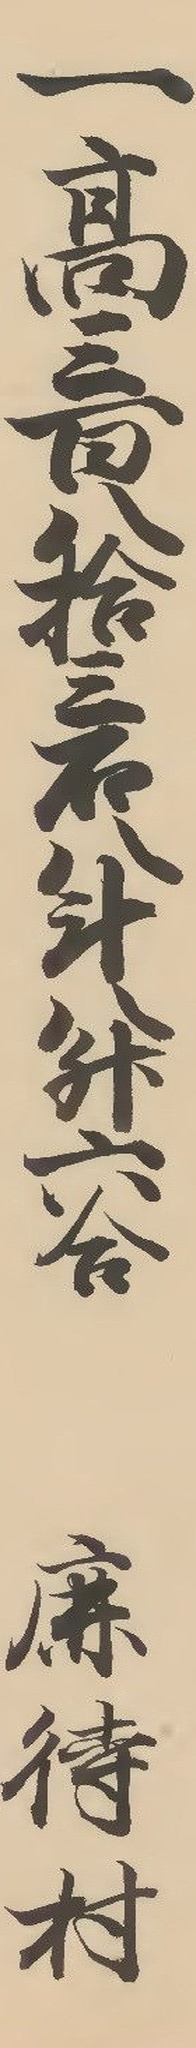一髙三百八拾三石八斗八升六合鹿待村
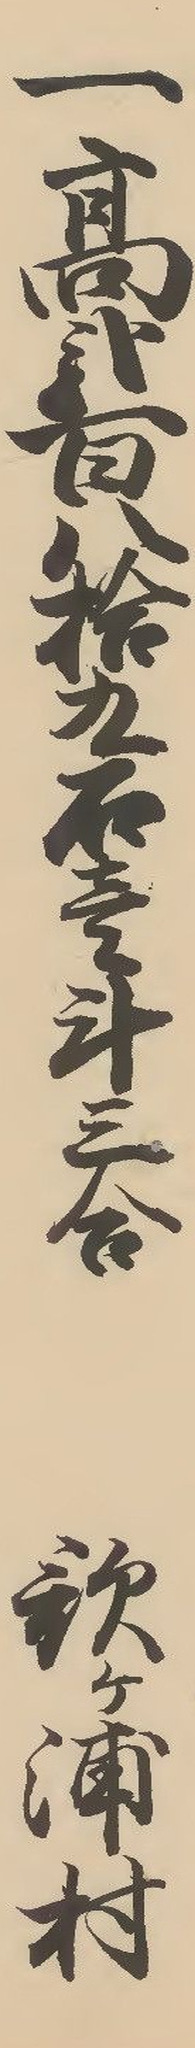一髙弐百八拾九石壱斗三合歌ケ浦村
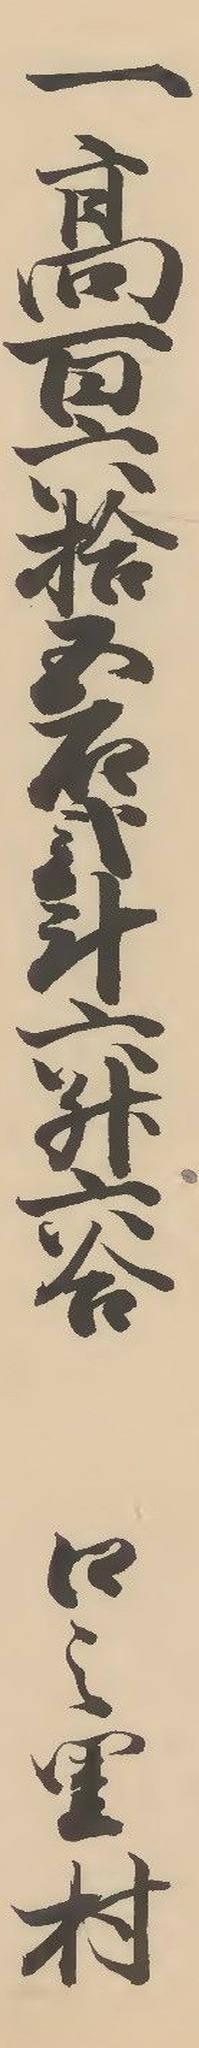一髙百六拾五石弐斗六升六合口之里村

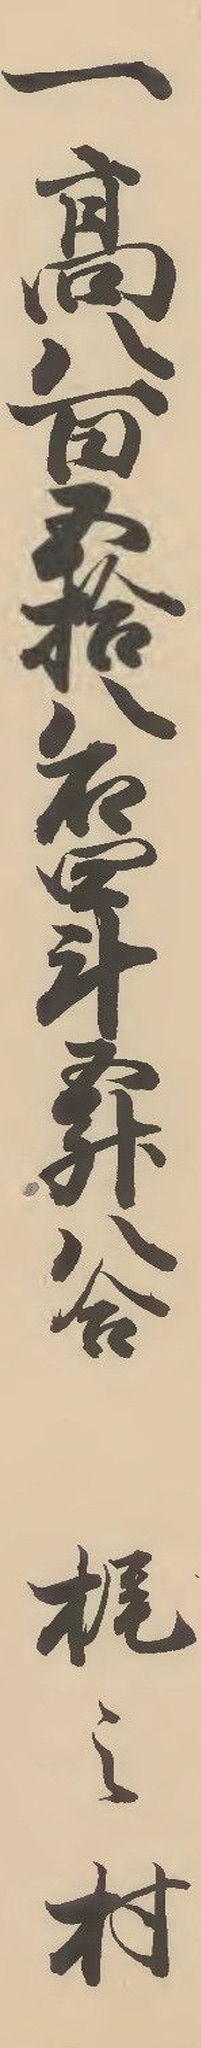一髙八百五拾八石四斗五升八合梶之村
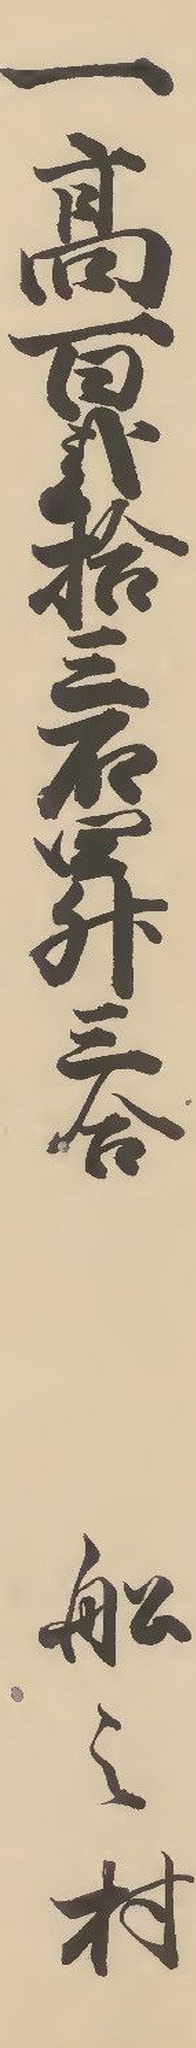一髙百弐拾三石四升三合舩之村
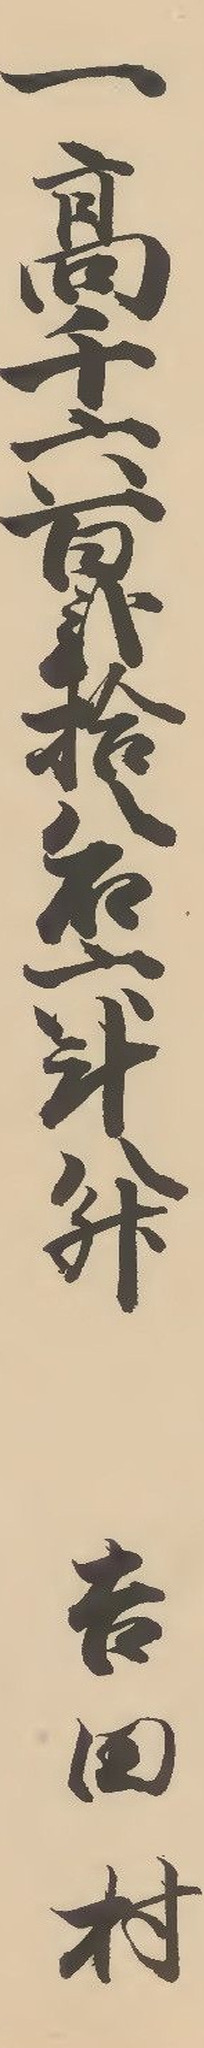一髙千六百弐拾八石六斗八升吉田村
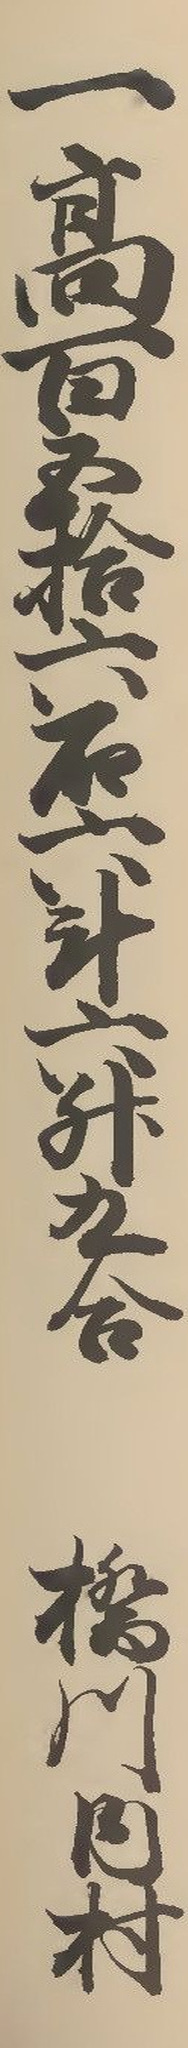一髙百五拾六石六斗六升九合橋川内村
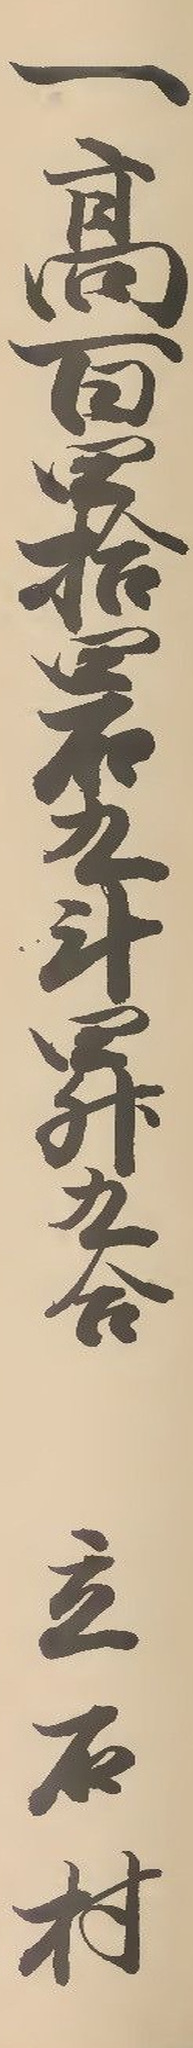一髙百四拾四石九斗四升九合立石村
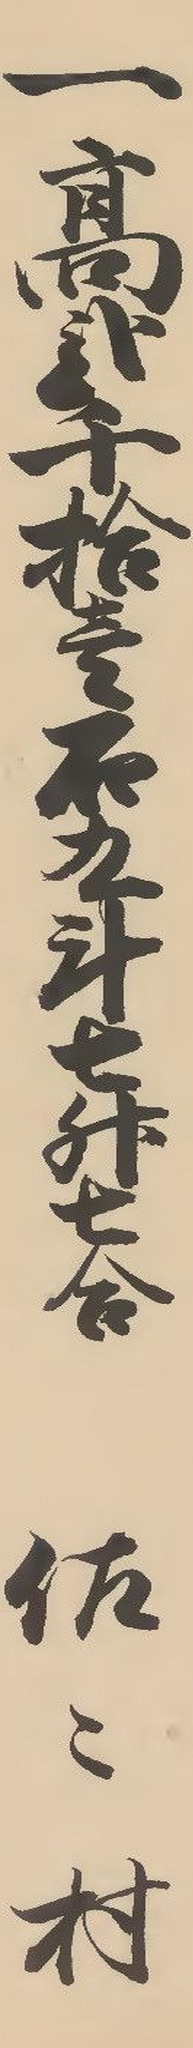一髙弐千拾壱石九斗七升七合佐々村
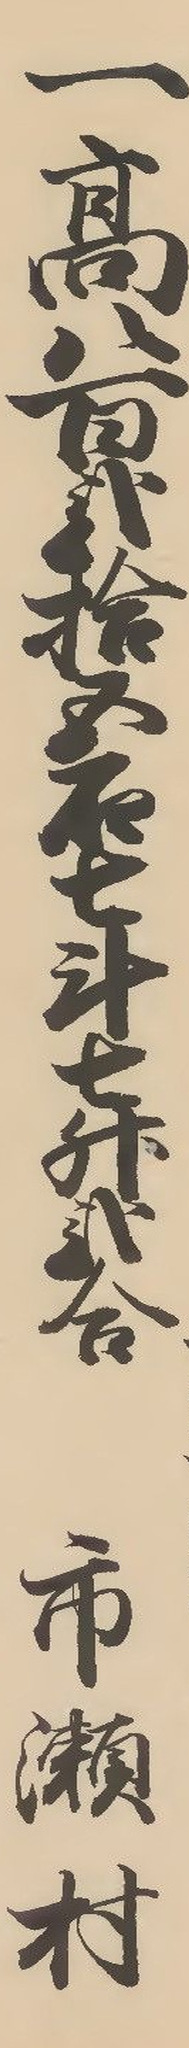一髙八百弐拾五石七斗七升弐合市瀬村
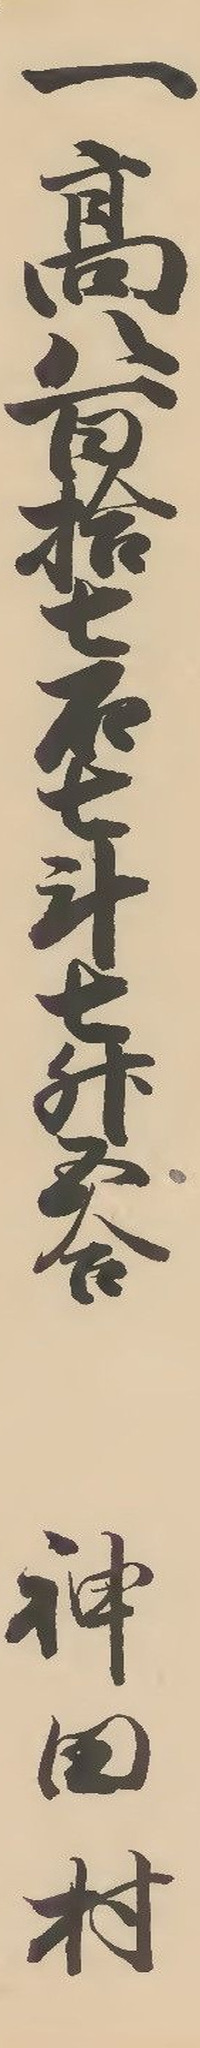一髙八百拾七石七斗七升五合神田村

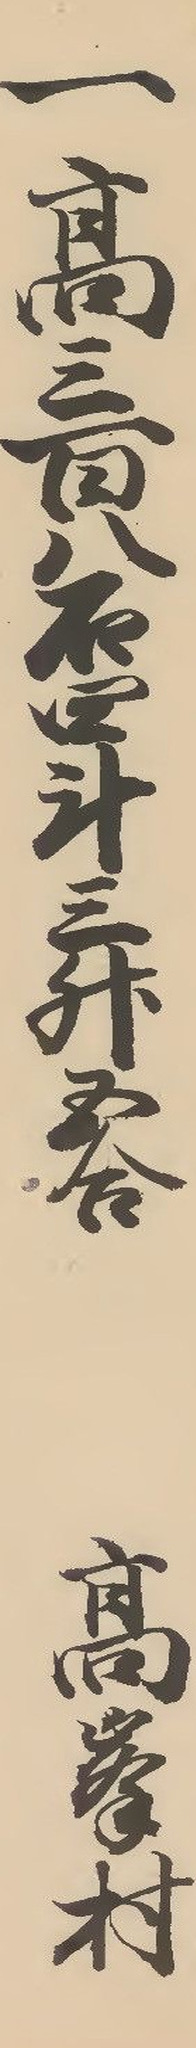一髙三百八石四斗三升五合高峯村
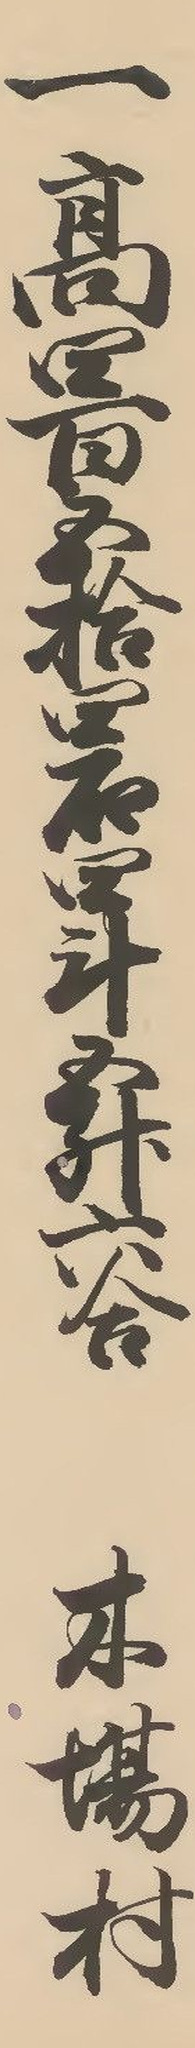一髙四百五拾四石四斗五升六合木場村
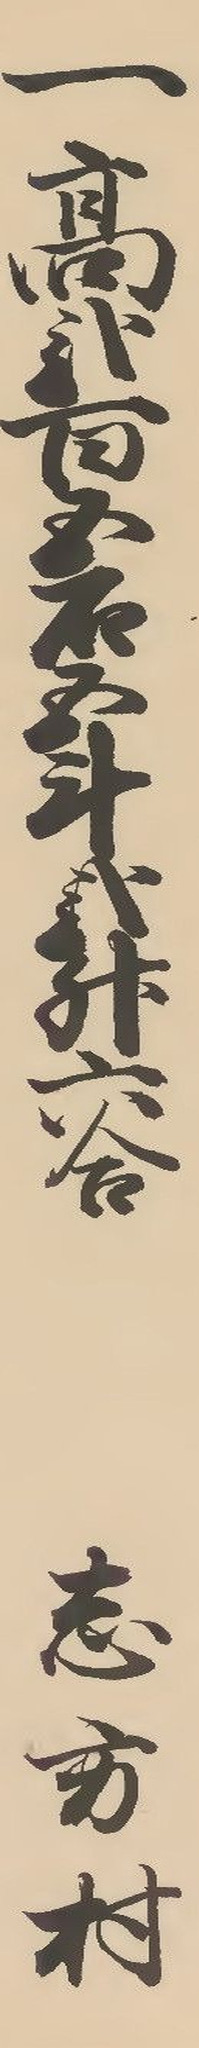一髙百百五石五斗弐升六合志方村
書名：肥前国郷帳
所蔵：国立公文書館 National Archives of Japan
